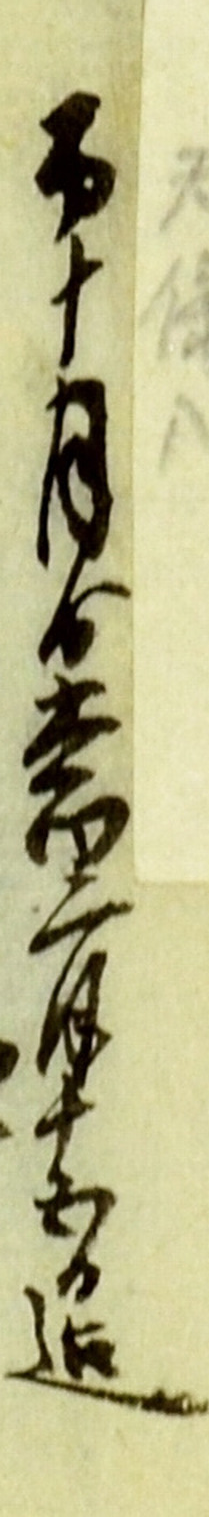酉十月ヨリ当二月十五日迄
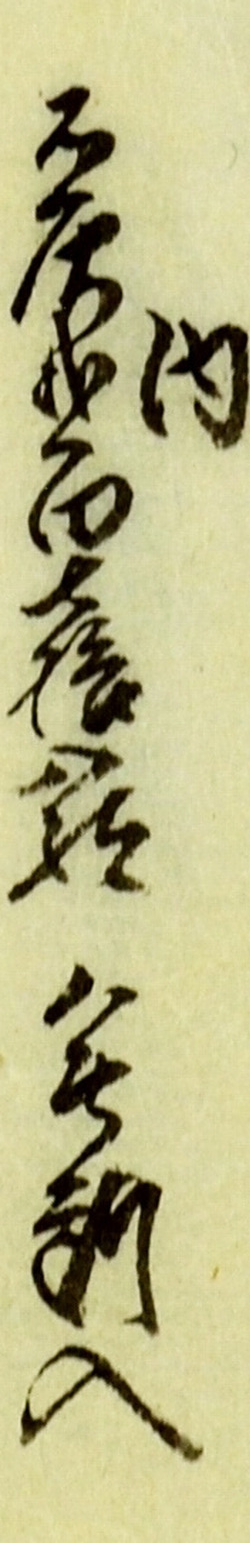石灰弐百七拾八駄会所入
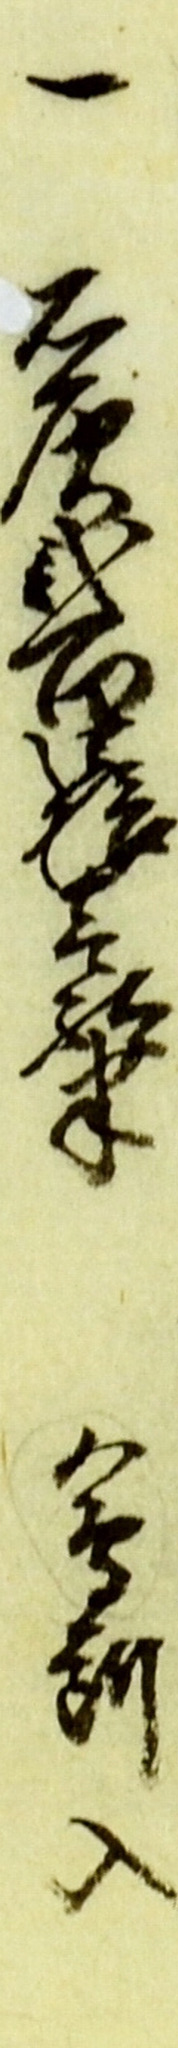一石灰弐百四拾壱駄半会所入
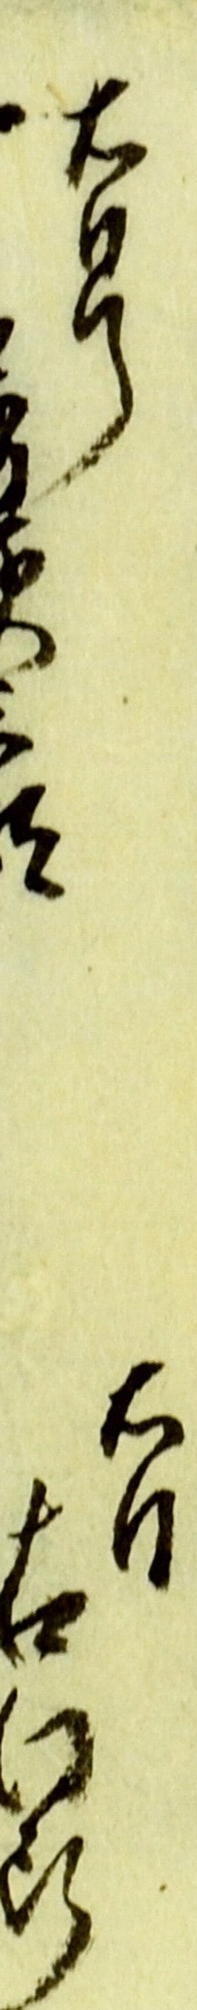右同断右同断
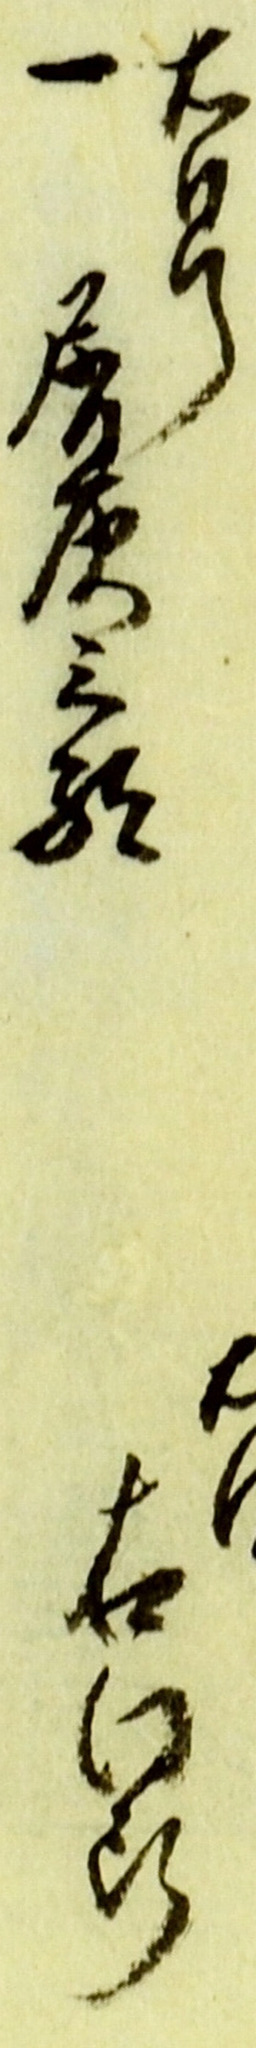一層灰三駄右同断
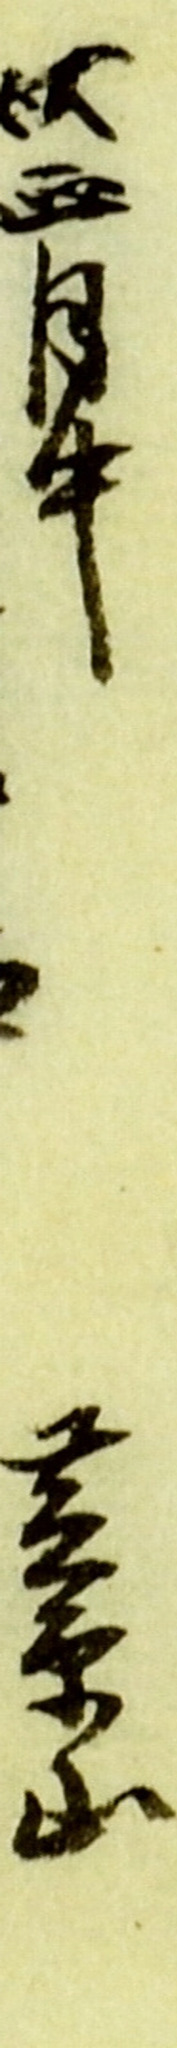戌正月中芝原山
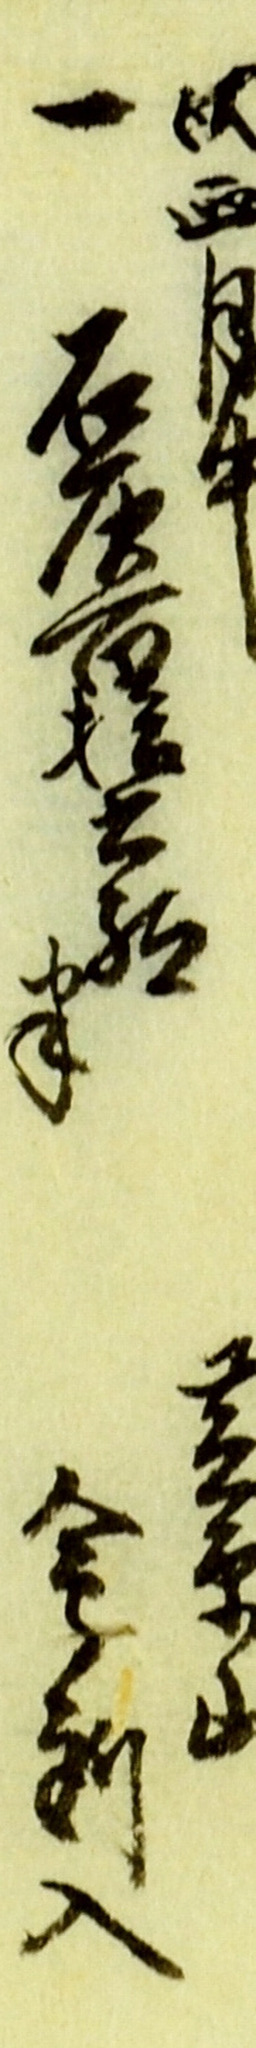一石灰百拾六駄会所入
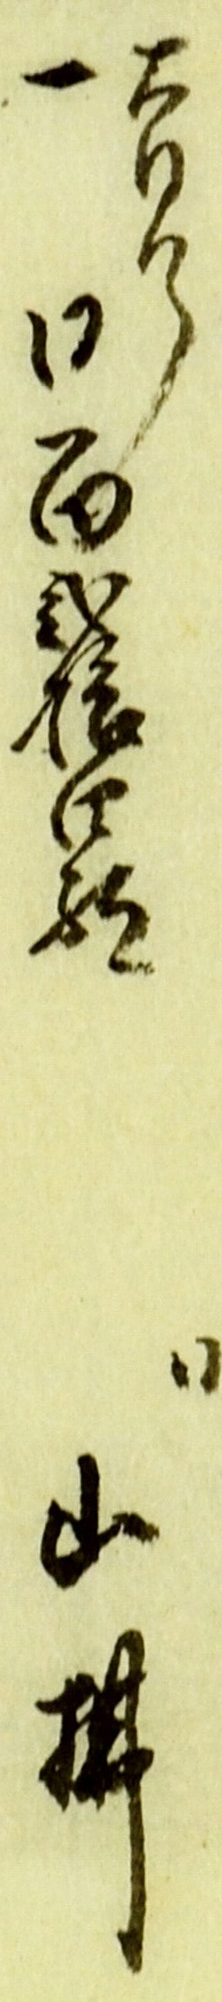一同百弐拾四駄山払
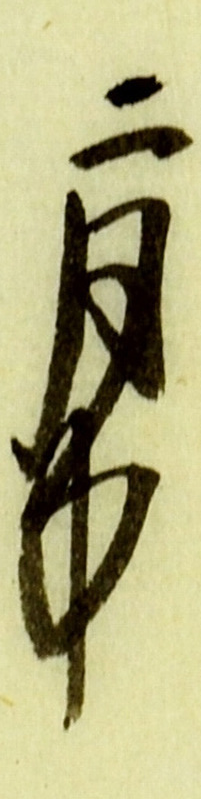二月中
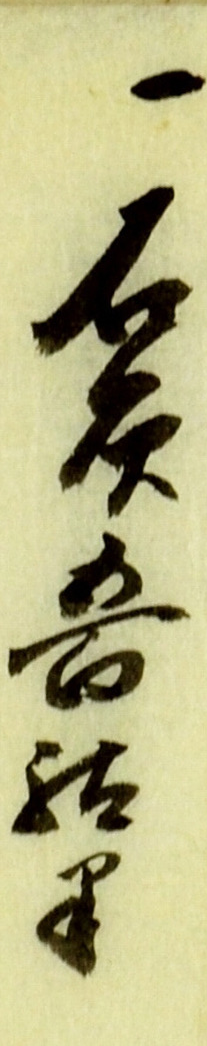一石灰九百駄萩尾
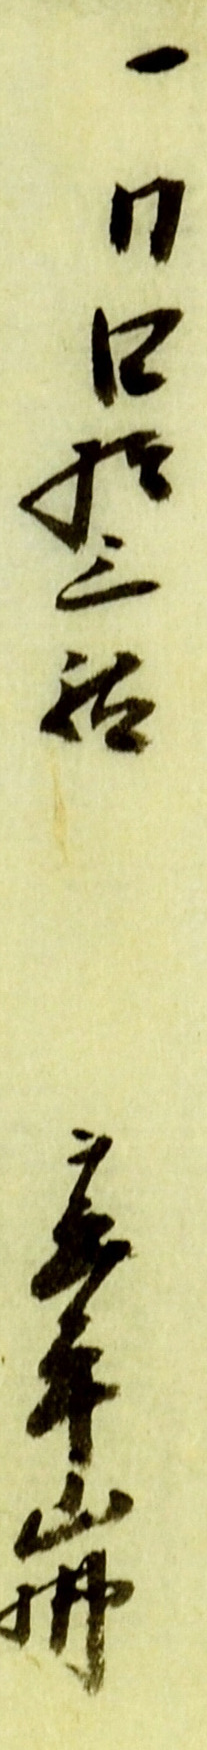一同四拾三駄亥年山払
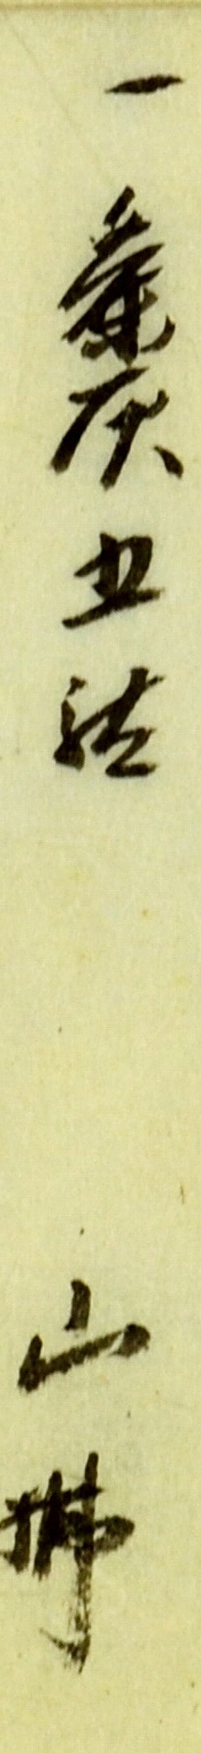一麁灰五駄山払
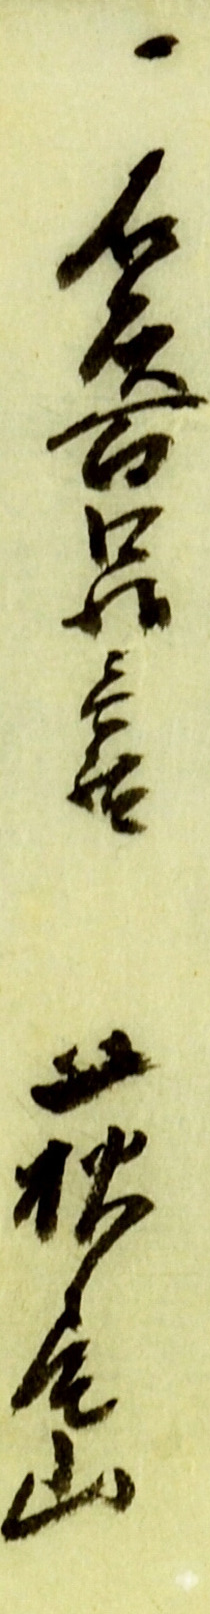一石灰百四拾壱駄萩尾山
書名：覚
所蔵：伊那市立高遠町図書館・合同会社AMANE
